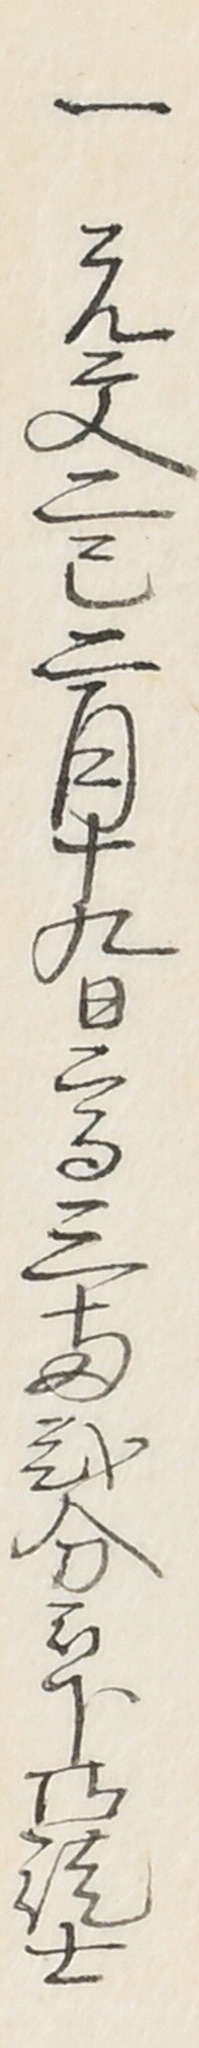一元文二巳二月十九日高三両弐分被下御徒士
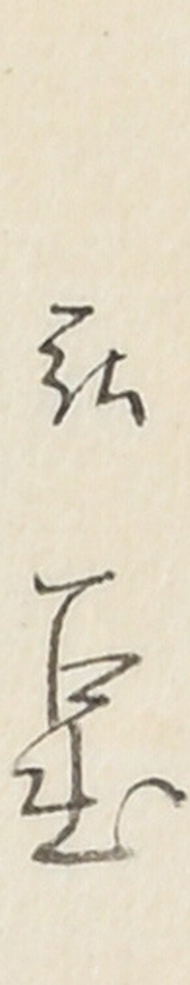被召出
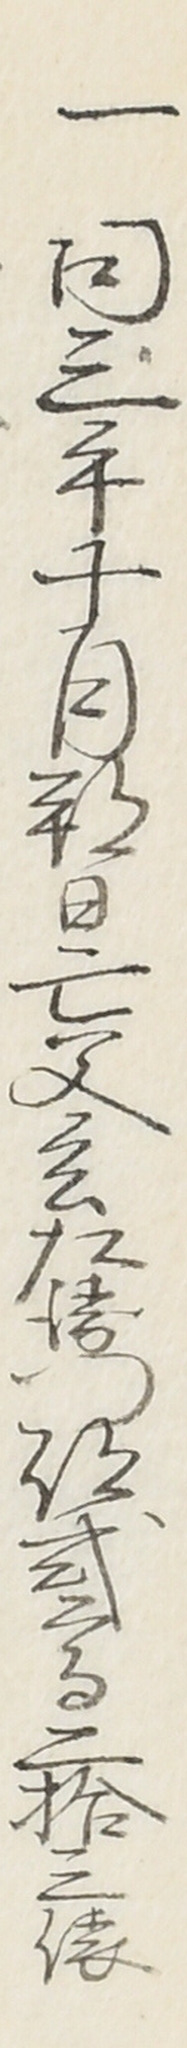一同三午十月朔日亡父玄左衛門跡式高二拾三俵
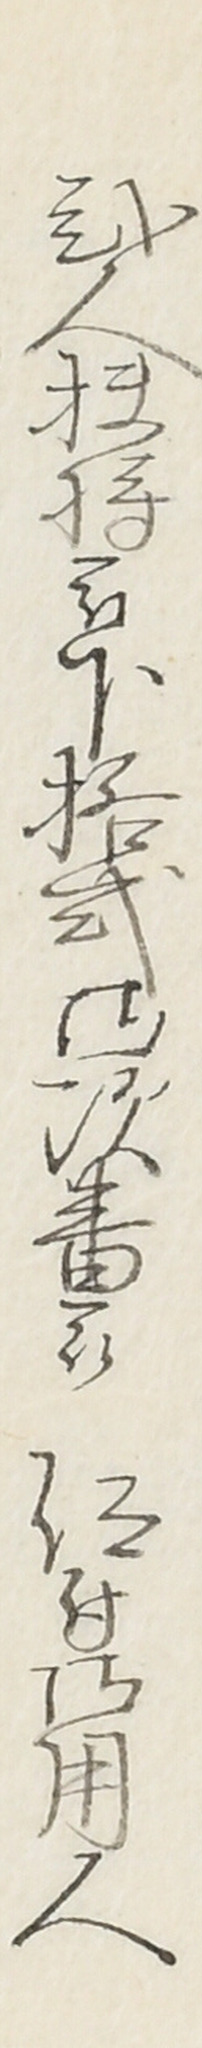弐人扶持被下格式御次番被仰付御用人
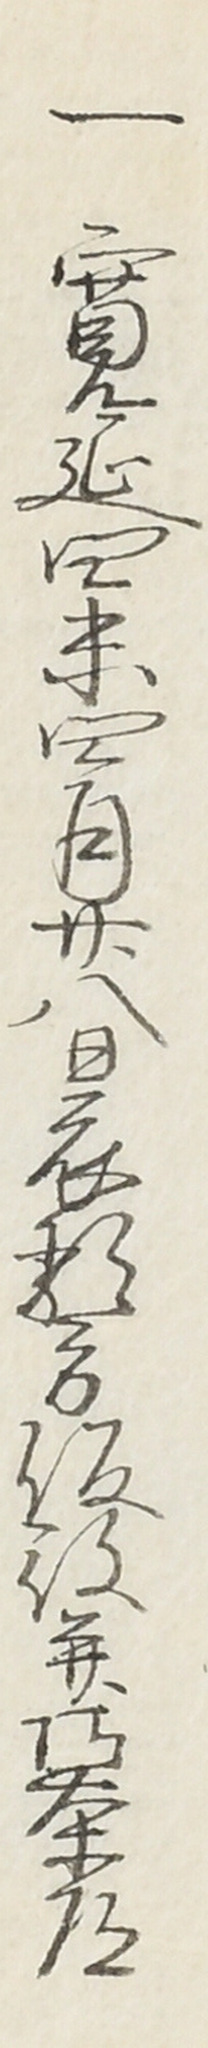一寛延四未四月廿八日衣類方仮役并御茶道
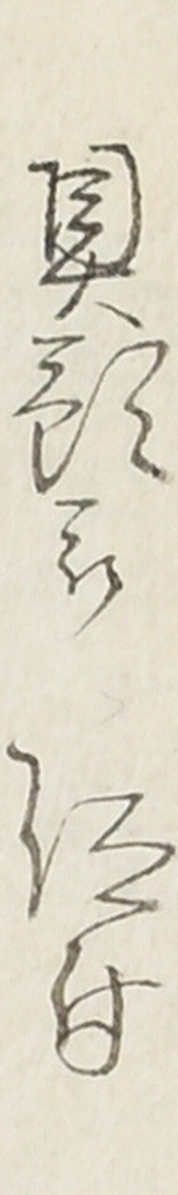具預被仰付
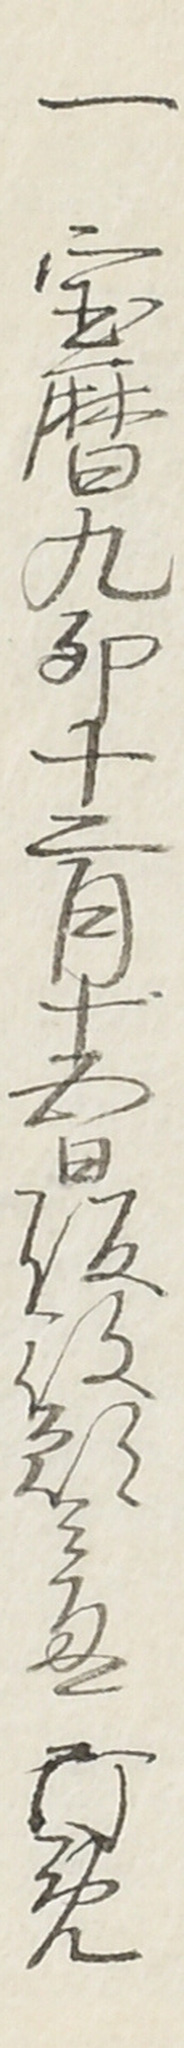一宝暦九卯十二月十五日仮役願之通御免
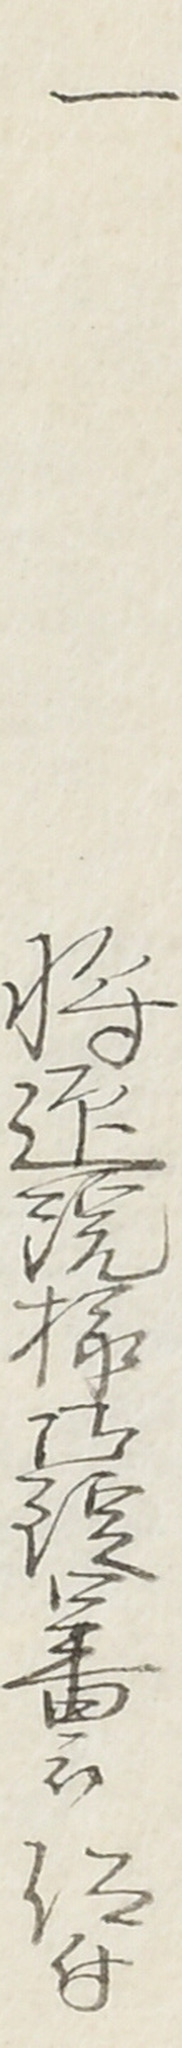一将迎院様御錠口番被仰付
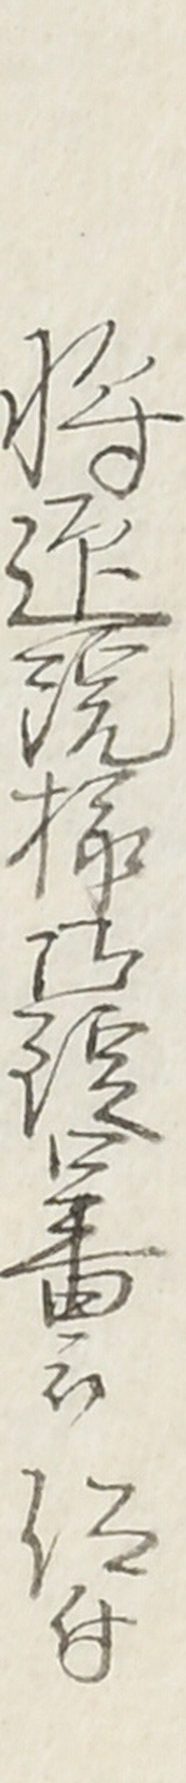一将迎院様御錠口番被仰付
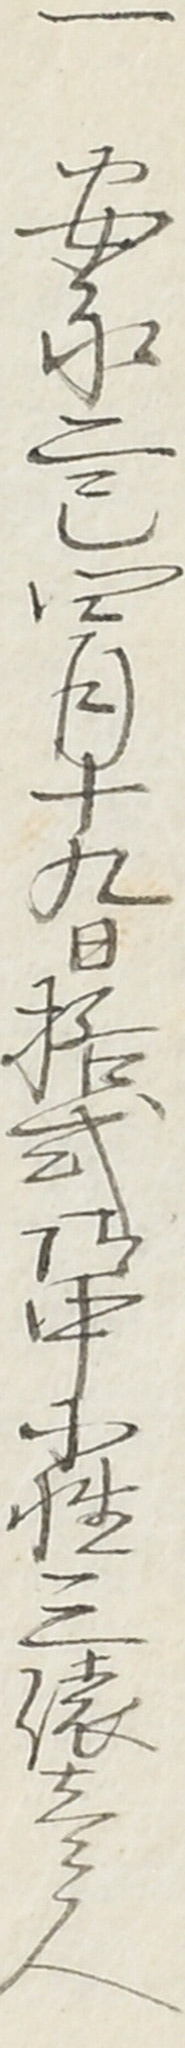一安永二巳四月十九日格式御中小性三俵壱人
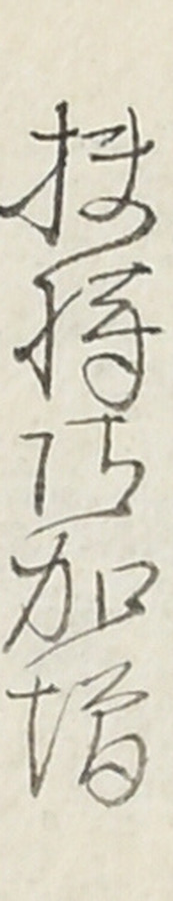扶持御加増
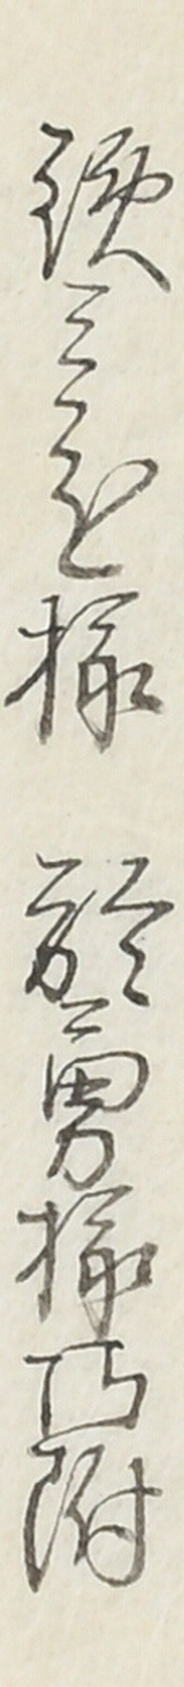鉄之進様於勇様御附
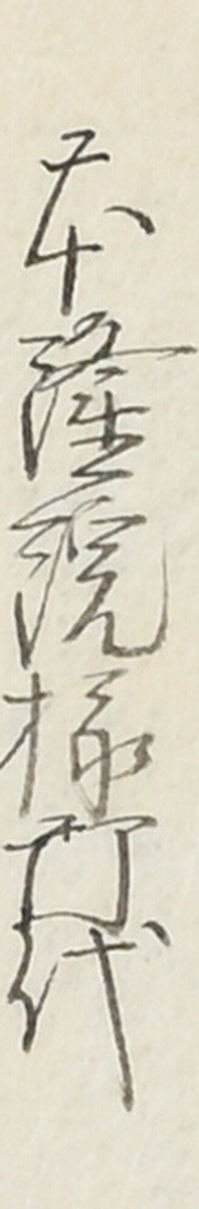本隆院様御代
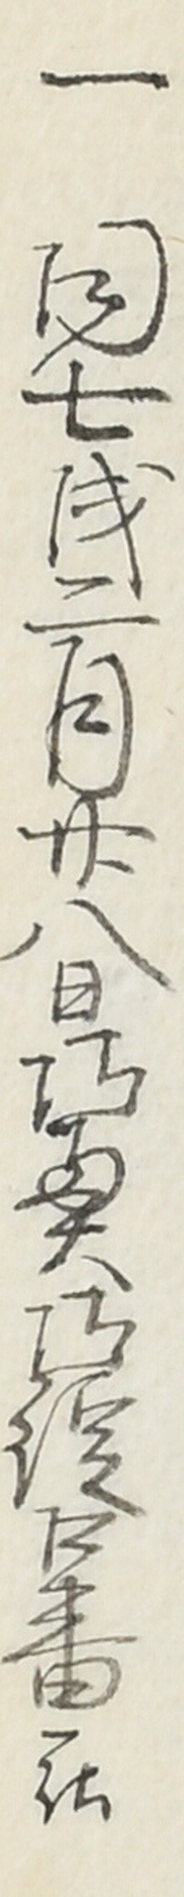一同七戌二月廿八日御奥御錠口番被
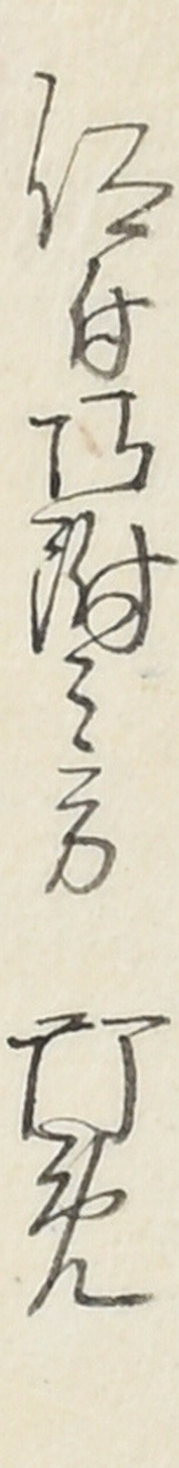仰付御附之方御免

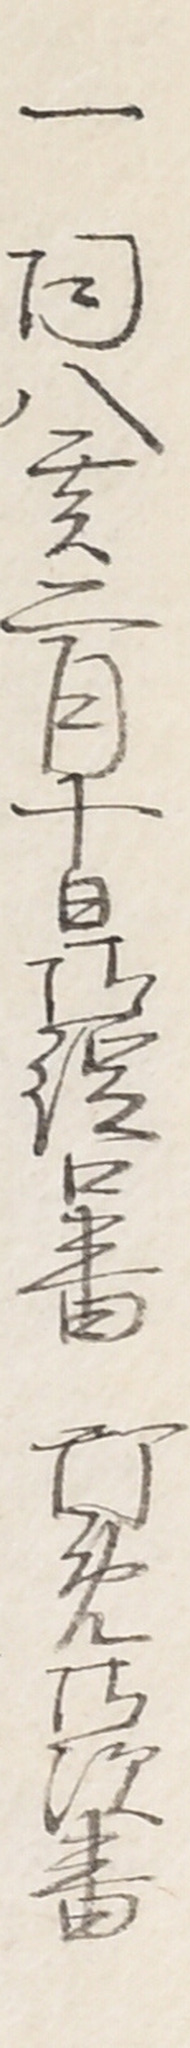一同八亥二月十日御錠口番御免御次番
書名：給人諸士勤仕録（七）
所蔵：伊那市立高遠町図書館・合同会社AMANE
